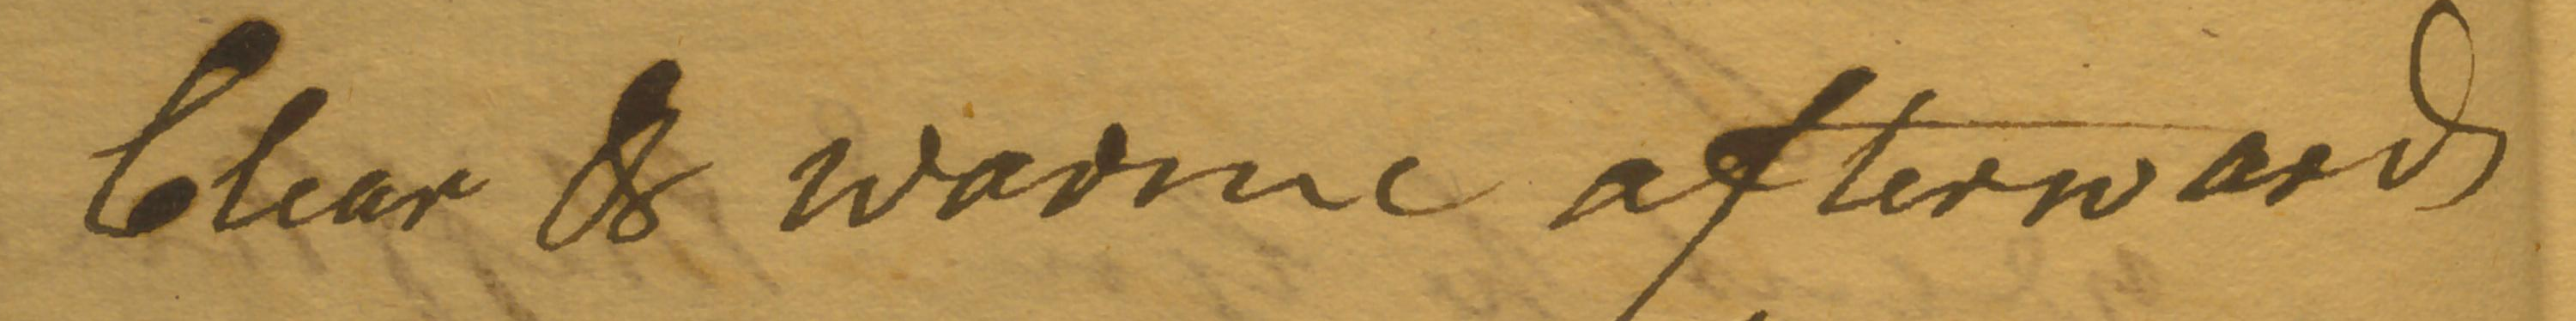Clear & warme afterward
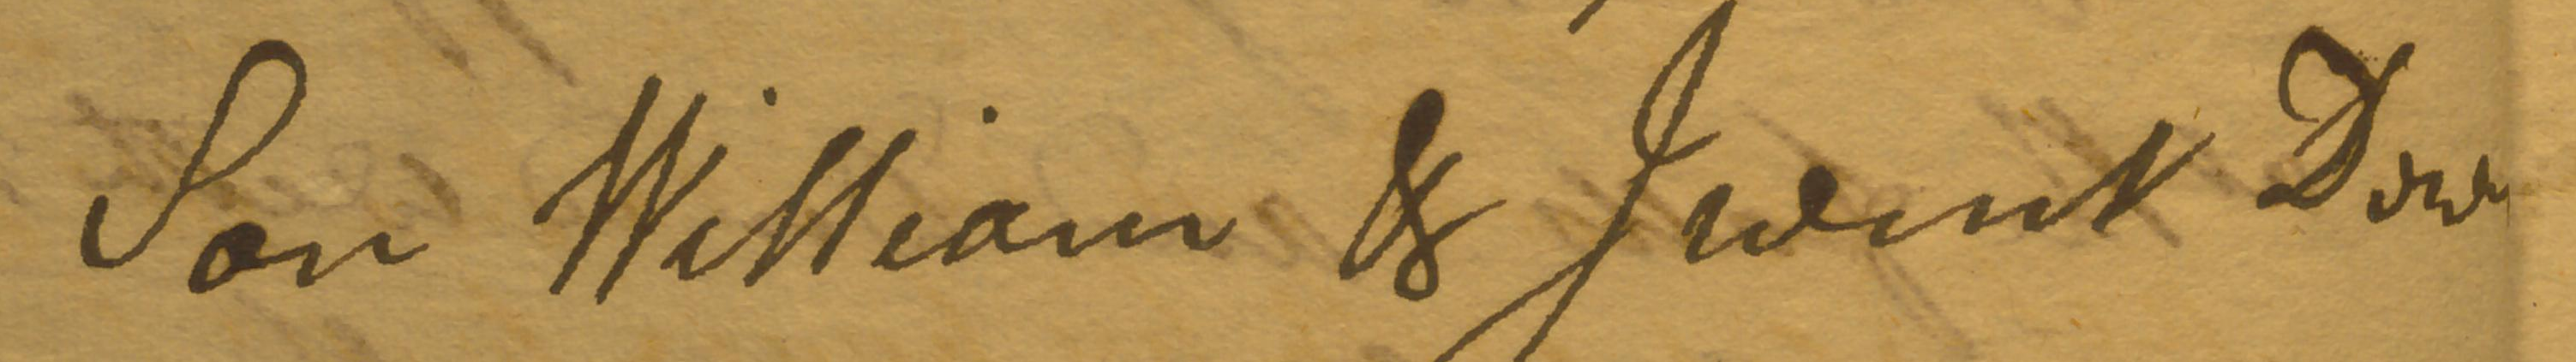Son William & I went Down
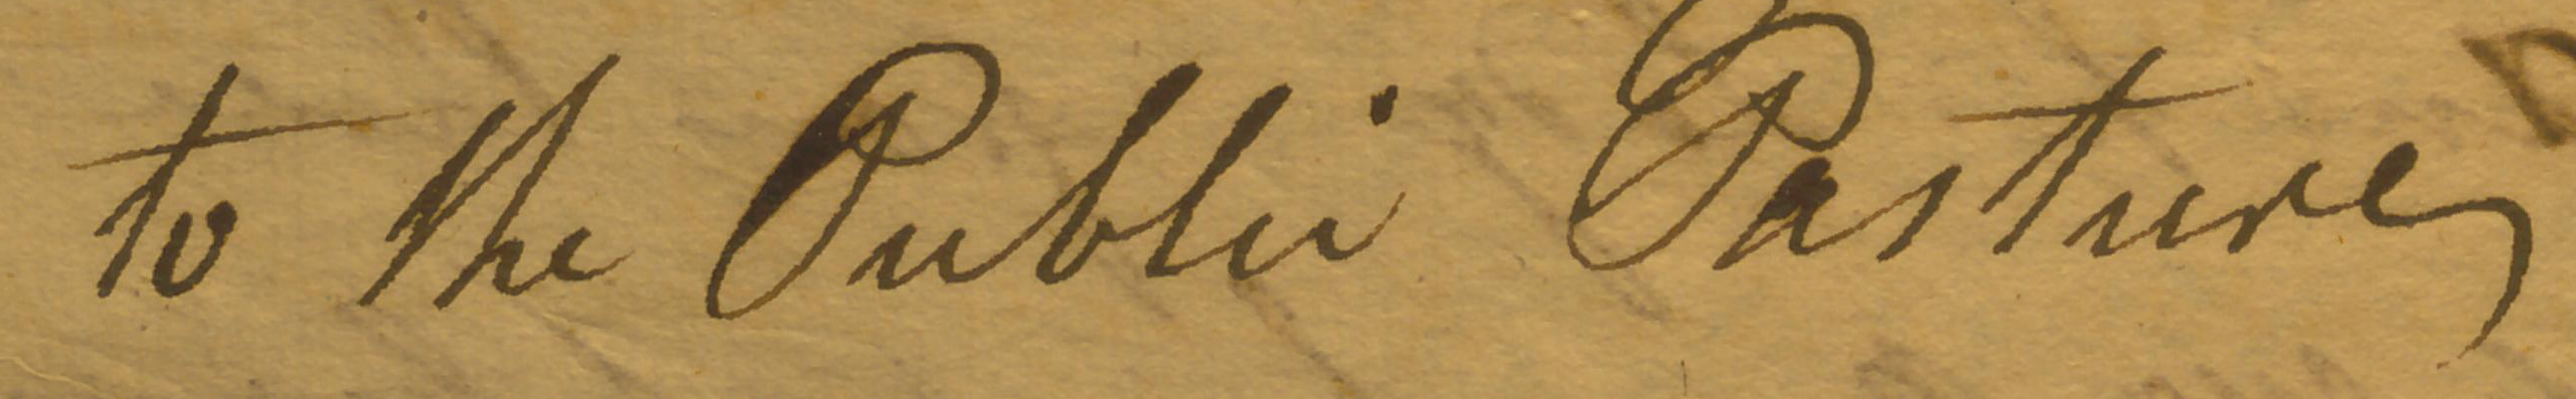to the Public Pasture
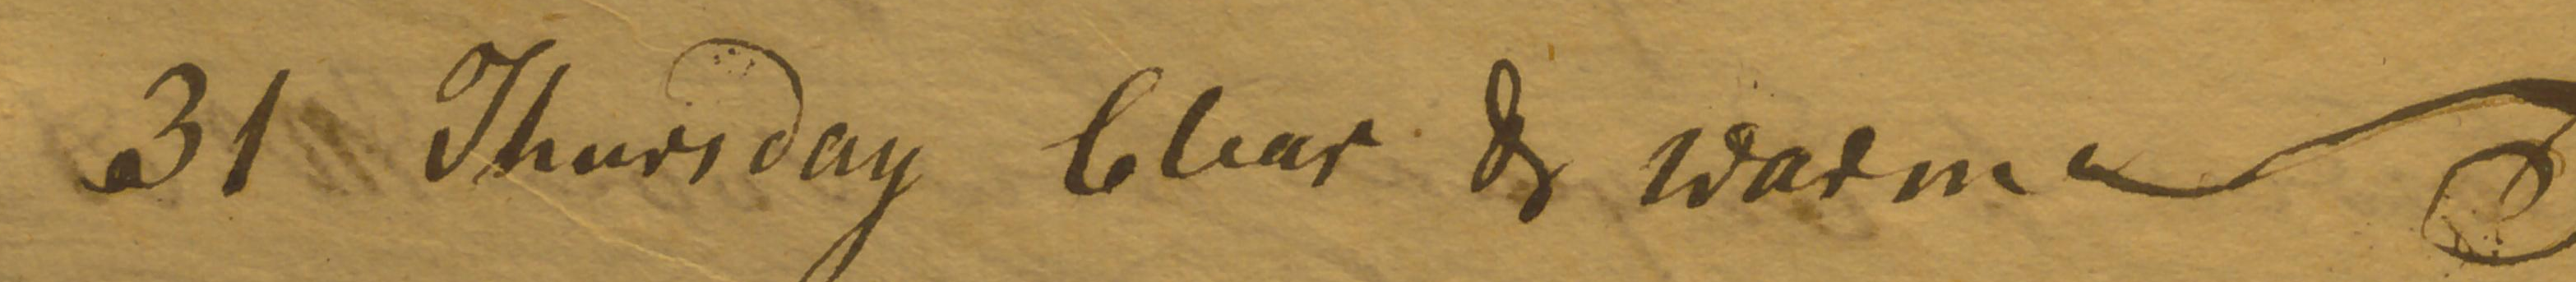31 Thursday Clear & Warme
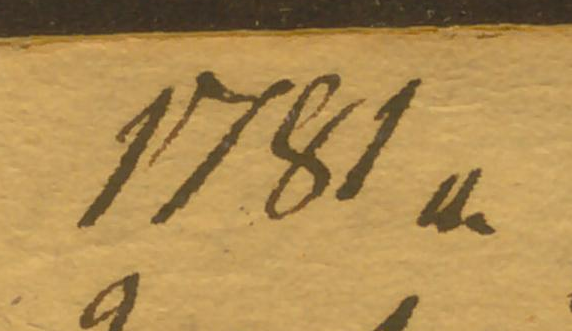1781
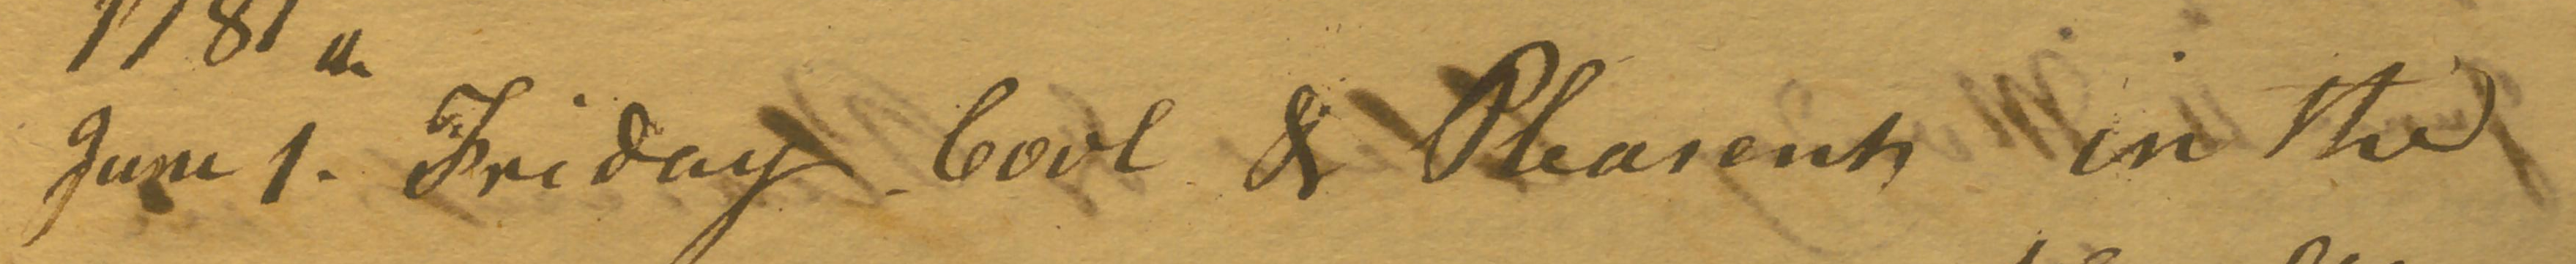June 1^th. Friday Cool & Pleasent in the
